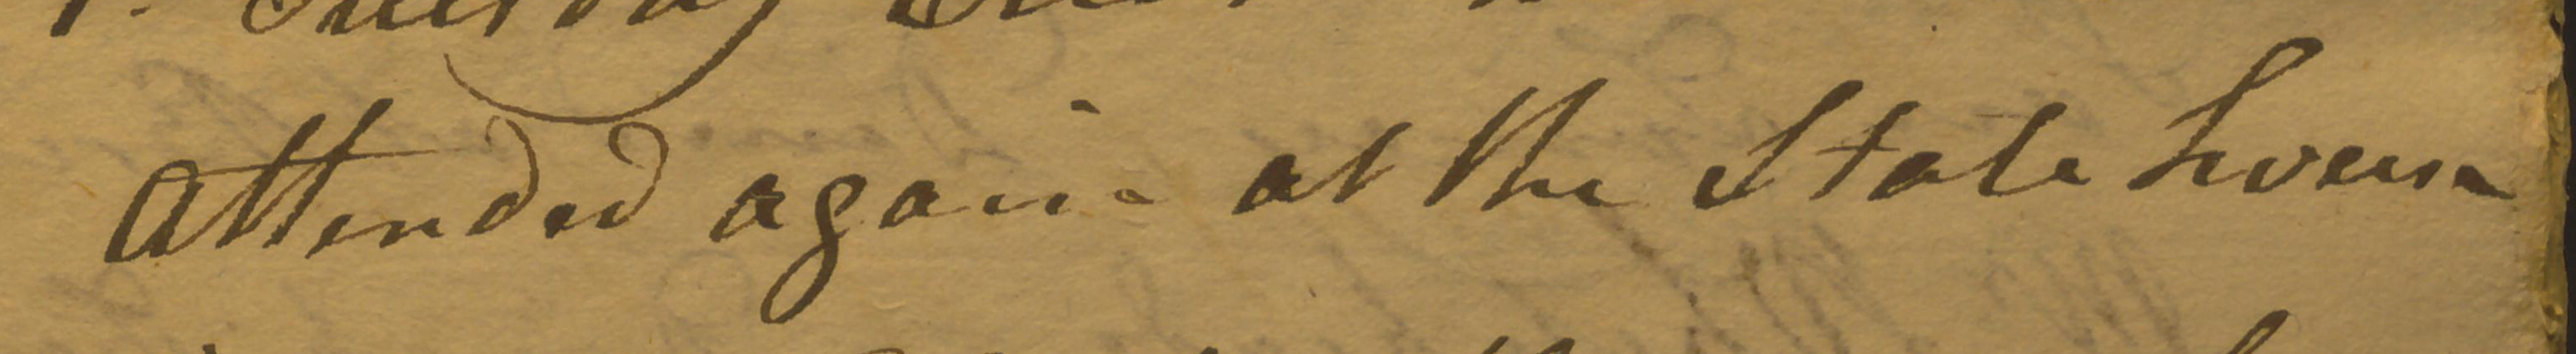Attended again at the State house
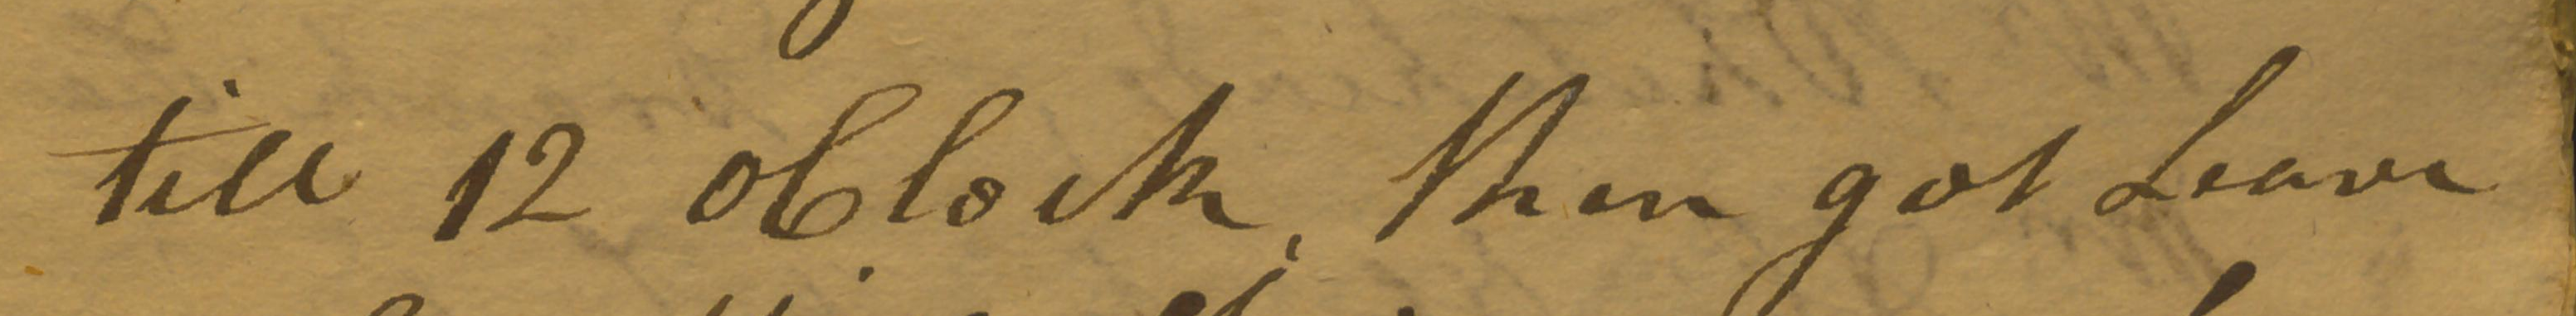till 12 oClock Then got Leave
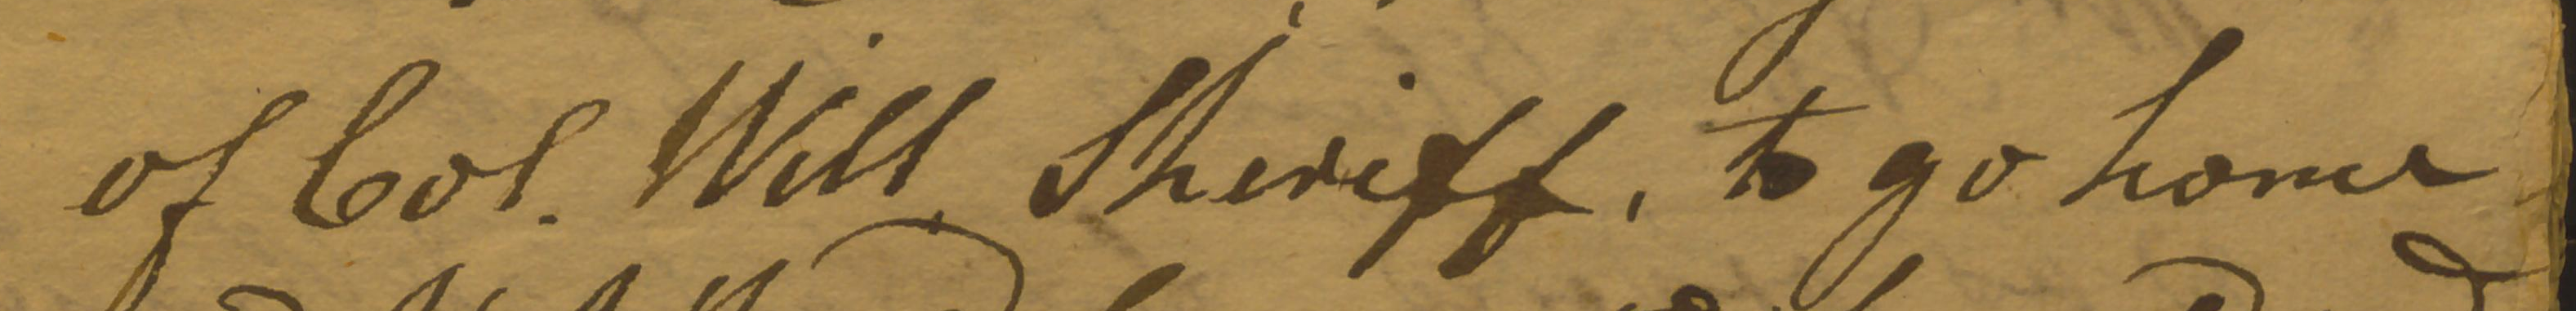of Col Wilt Sheriff, to go home
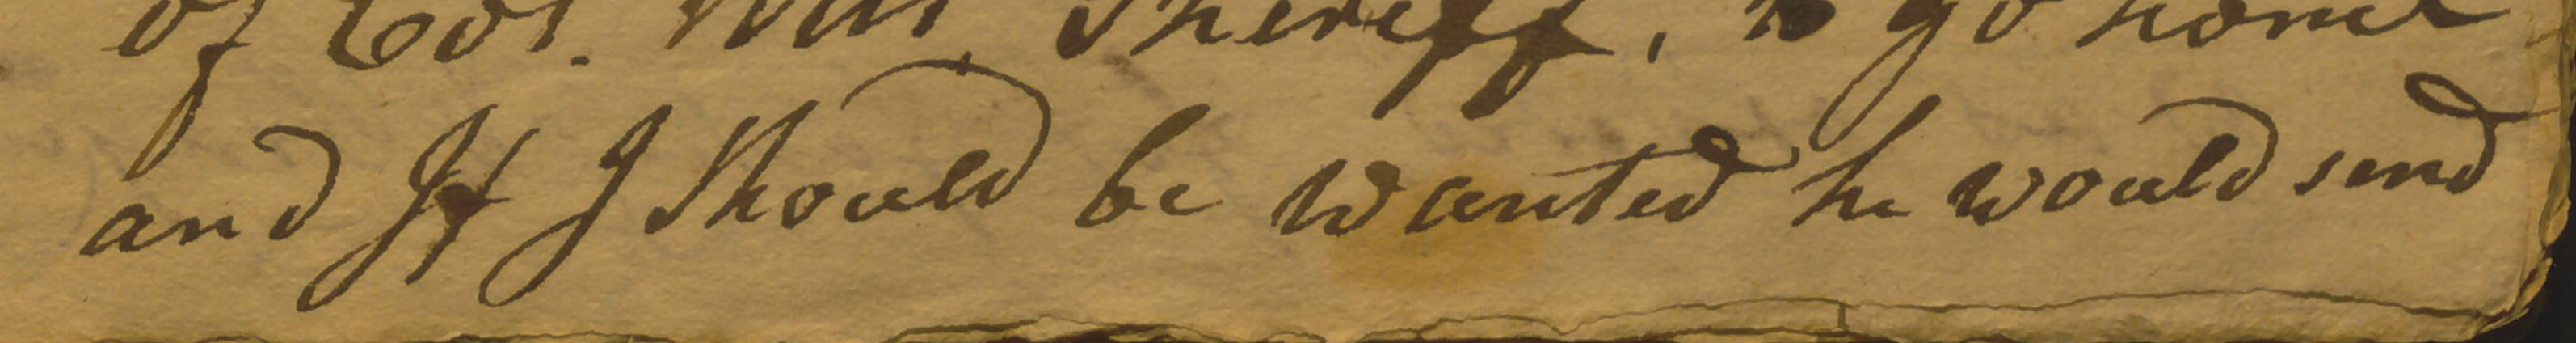and If I should be wanted he would send
